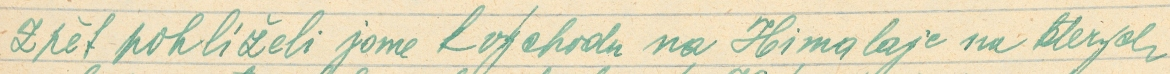zpět pohlíželi jsme k východu na Himalaje na kterých
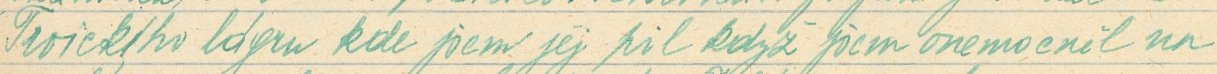Troického lágru kde jsem jej pil když jsem onemocněl na
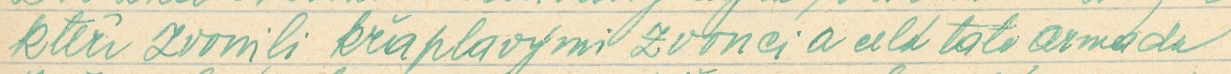kteří zvonili křaplavými zvonci a celá tato armáda
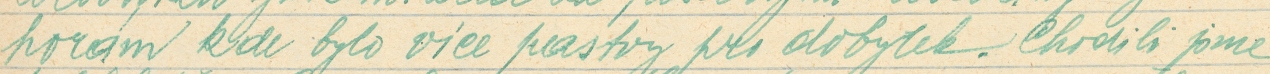horám kde bylo více pastvy pro dobytek. Chodili jsme
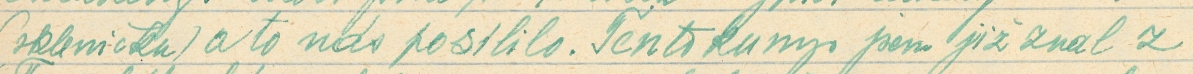(skleničku) a to nás posílilo. Tento kumys jsem již znal z
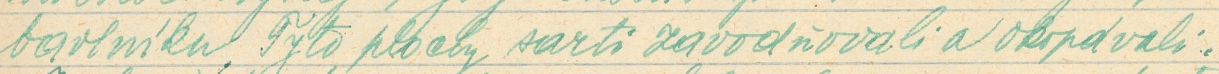bavlníku. Tyto plochy sarti zavodňovali a okopávali.
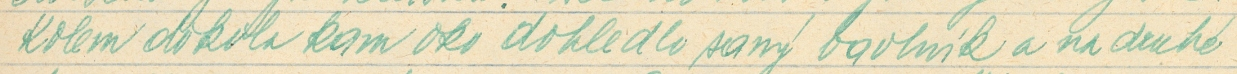Kolem dokola kam oko dohledlo samý bavlník a na druhé
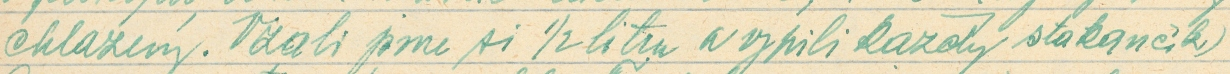chlazený. Vzali jsme si 1/2 litru a vypili každý stakančík)
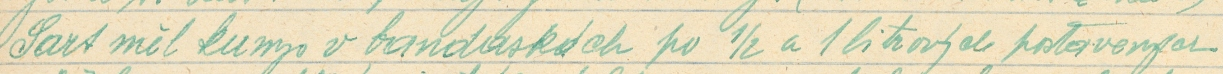Sart měl kumys v bandaskách po 1/2 a 1 litrových postavených
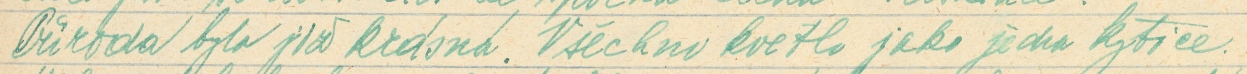Příroda byla již krásná. Všechno kvetlo jako jedna kytice.
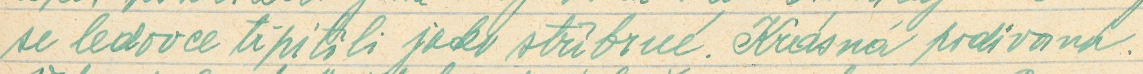se ledovce třpitili jako stříbrné. Krásná podívaná.
